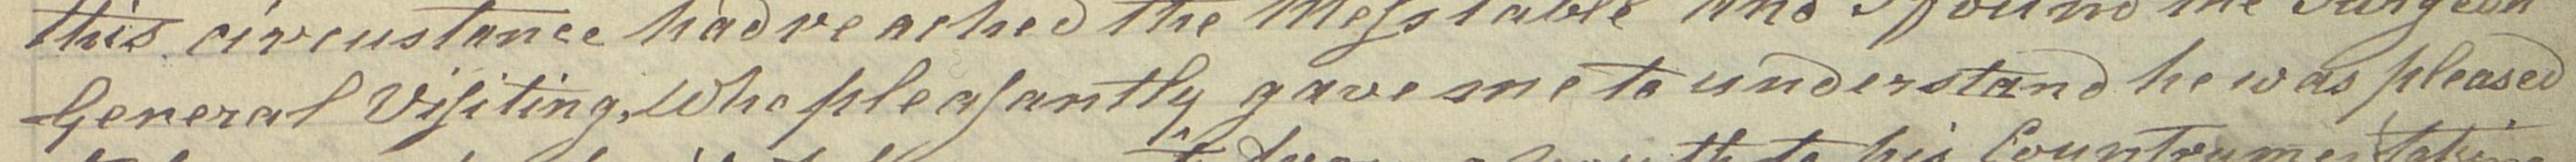General Visiting, who pleasantly gave me to understand he was pleased
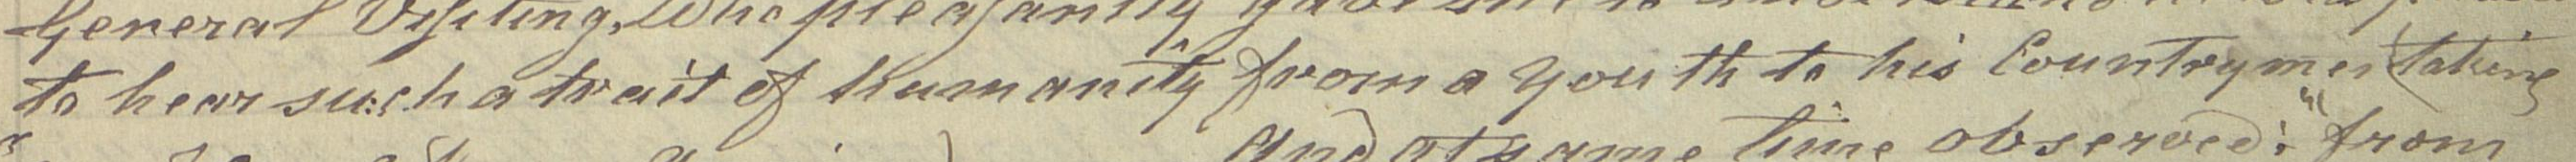to hear such a trait of humanity from a youth to his Countrymen (taking
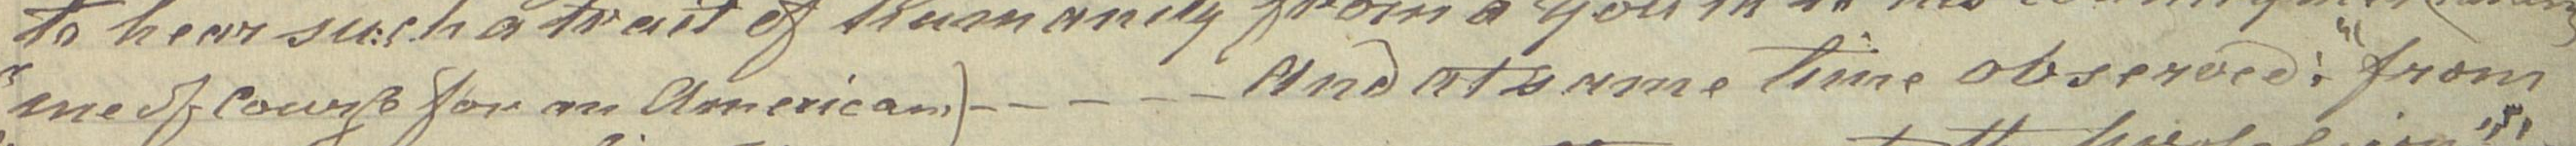me of course for an American) And at same time observed: "from
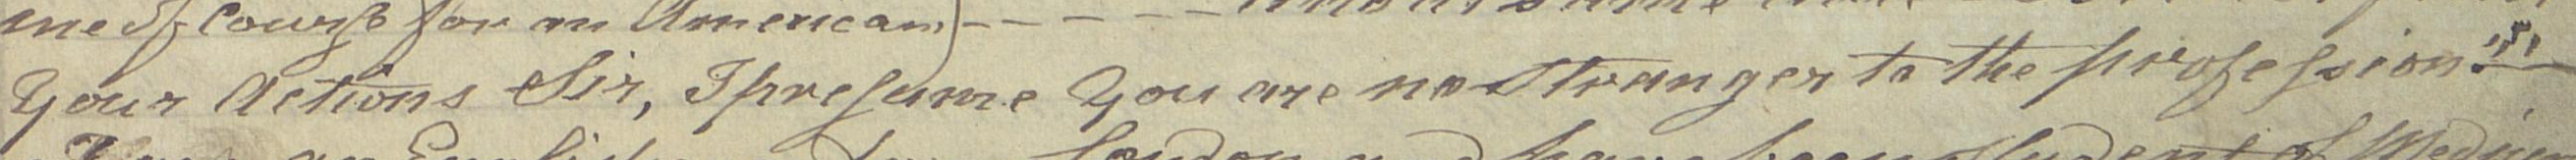Your Actions Sir, I presume You are no stranger to the profession."
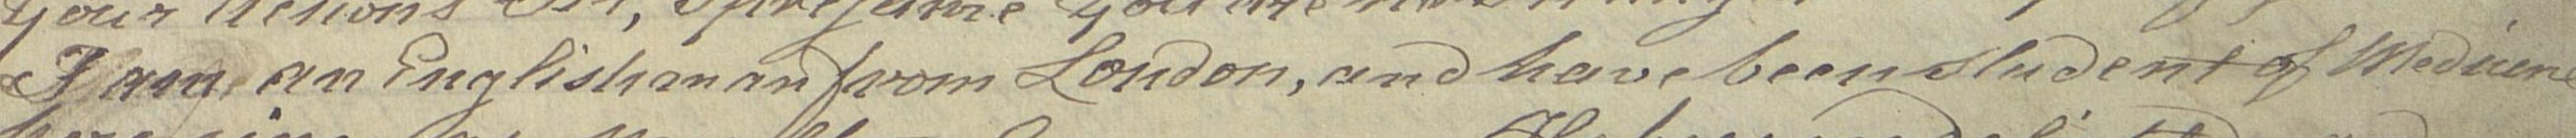I am an Englishman from London, and have been student of Medicine
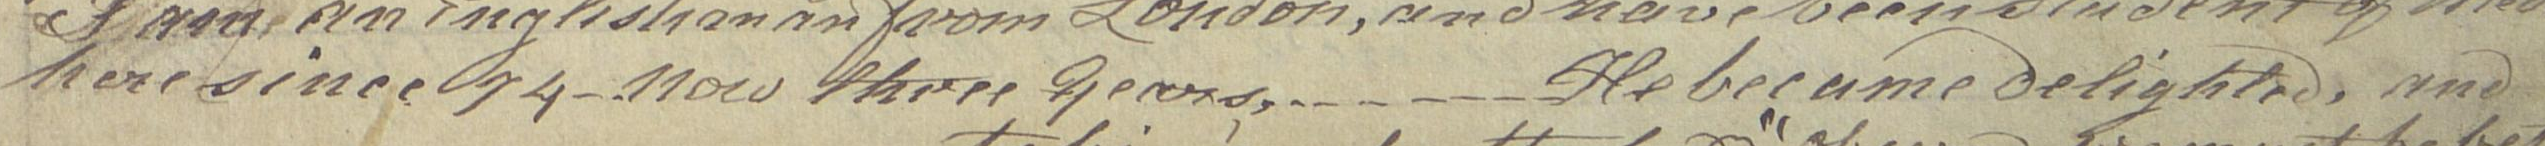here since 74. Now three Years. He became delighted, and
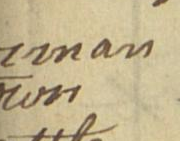-rrnan
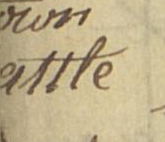attle
